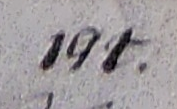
191.
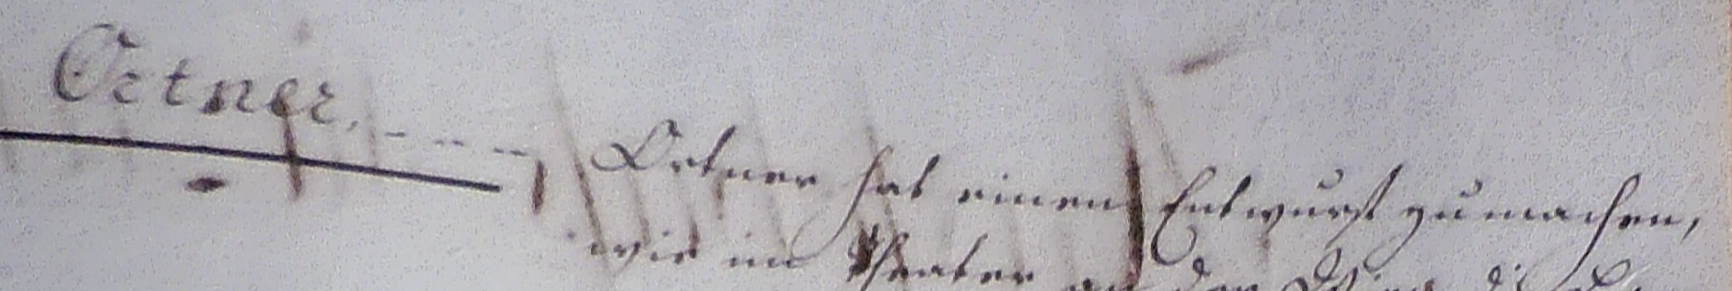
Ortner. .. .. .. Ortner hat einen Entwurf zumachen,
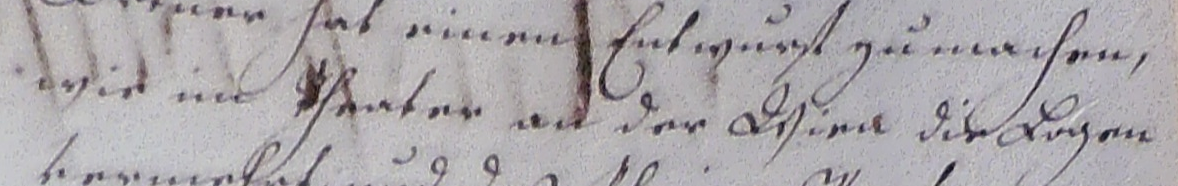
wie im Theater an der Wien die Logen
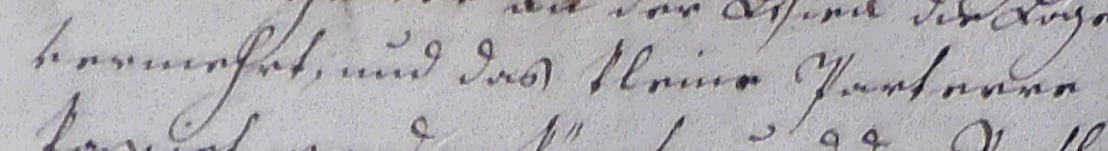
vermehrt, und das kleine Parterre
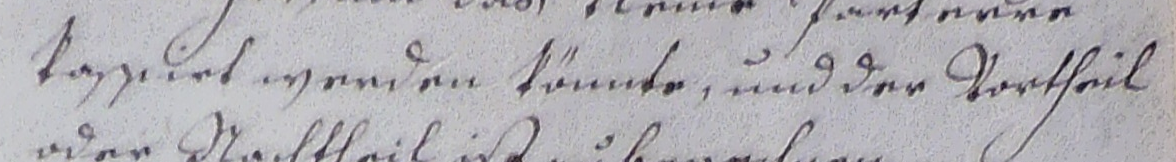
kassirt werden könnte, und der Vortheil
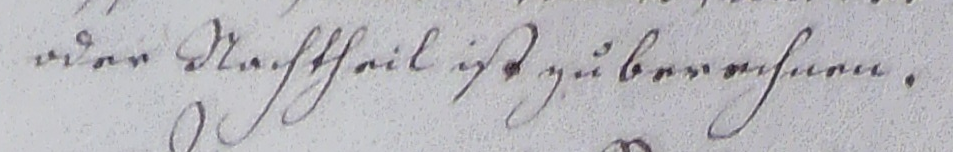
oder Nachtheil ist zu berechnen.
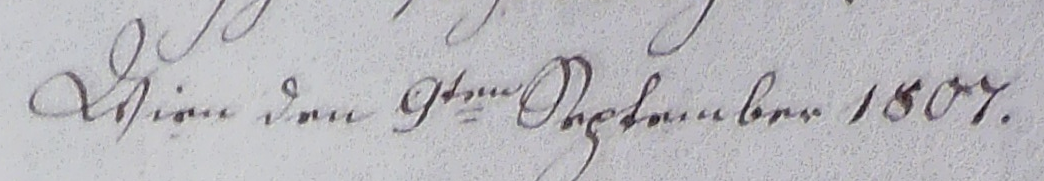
Wien den 9te͇n September 1807.
